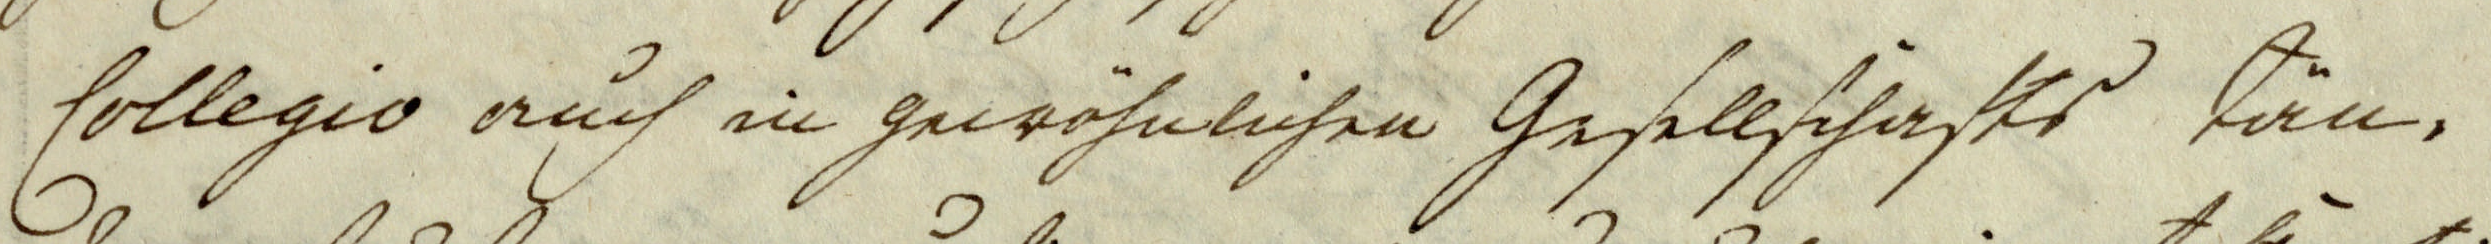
Collegio auch in gewöhnlichen Gesellschafts Tän¬
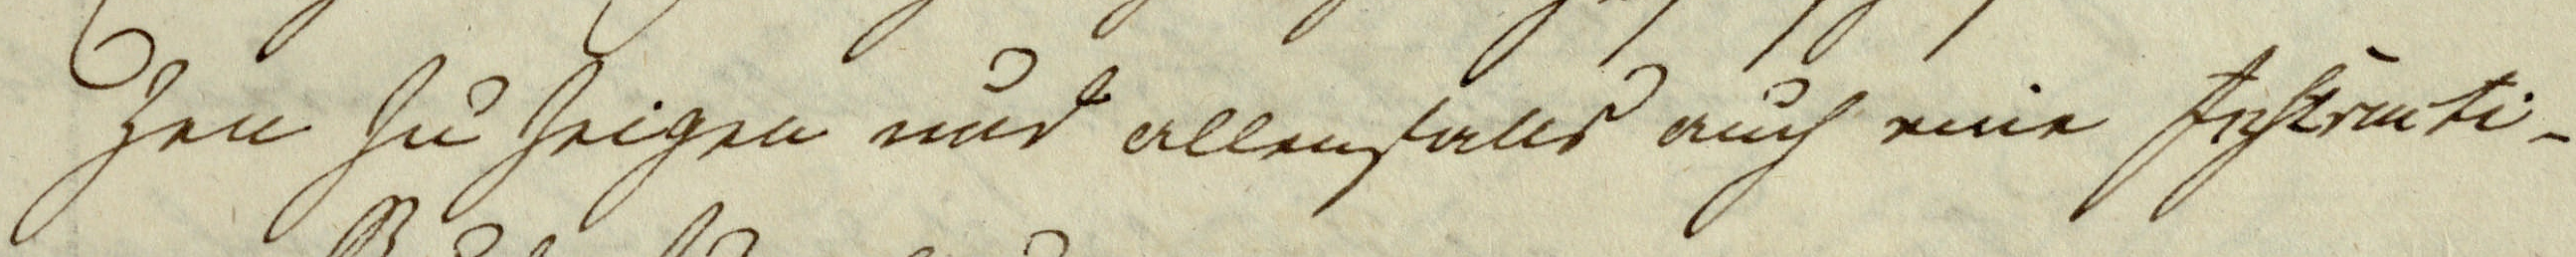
zen zu zeigen und allenfalls auch eine Instructi¬
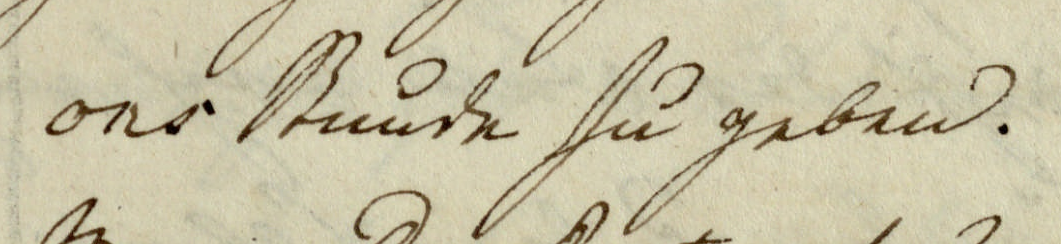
ons Stunde zu geben.
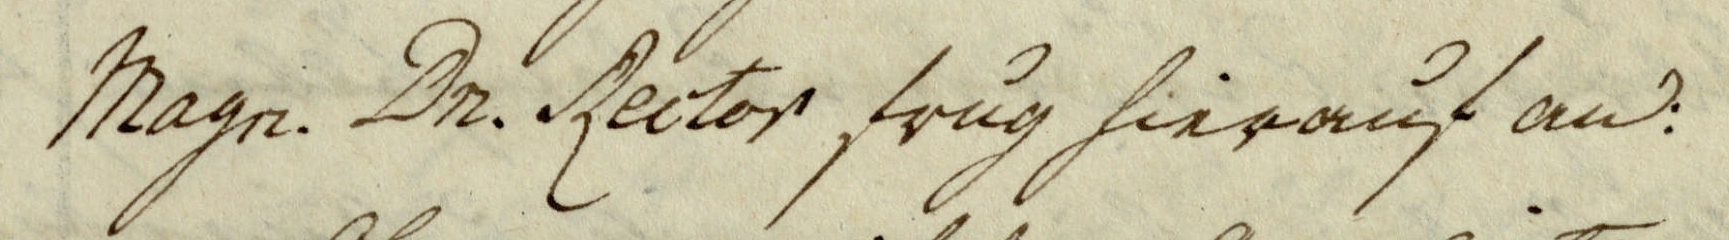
Magn. Dn. Rector frug hierauf an:
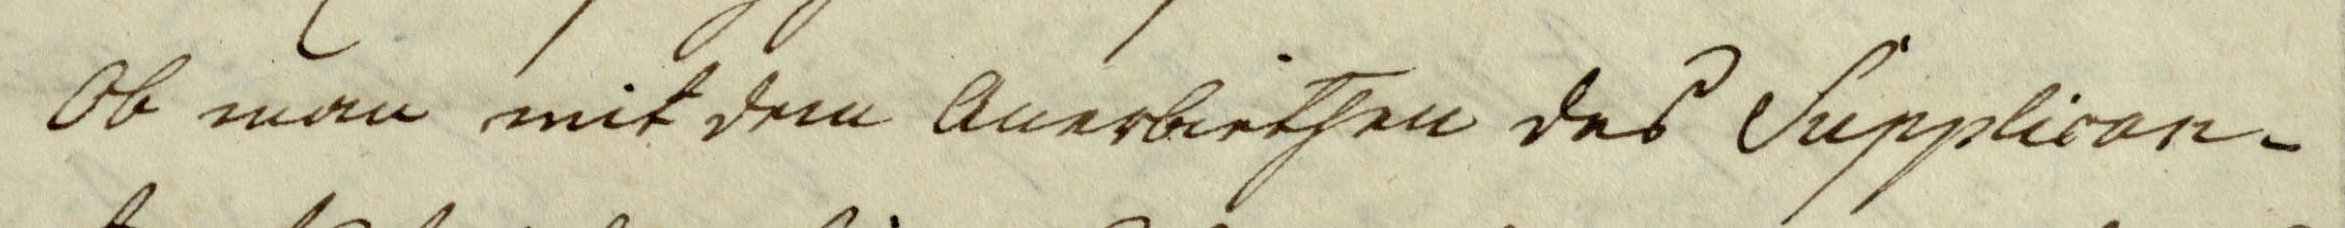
Ob man mit dem Anerbiethen des Supplican¬
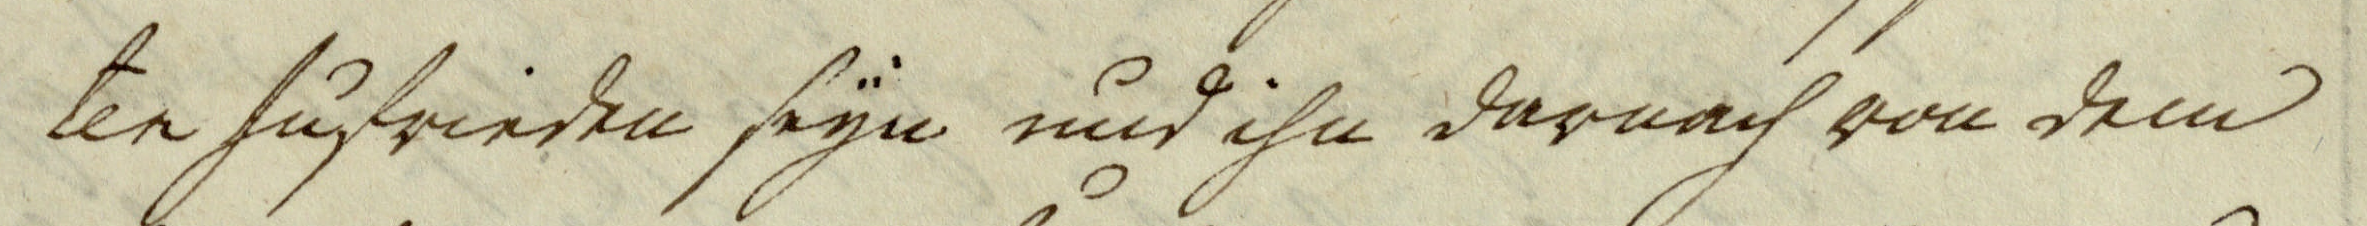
ten zufrieden seÿn und ihn darauf von dem
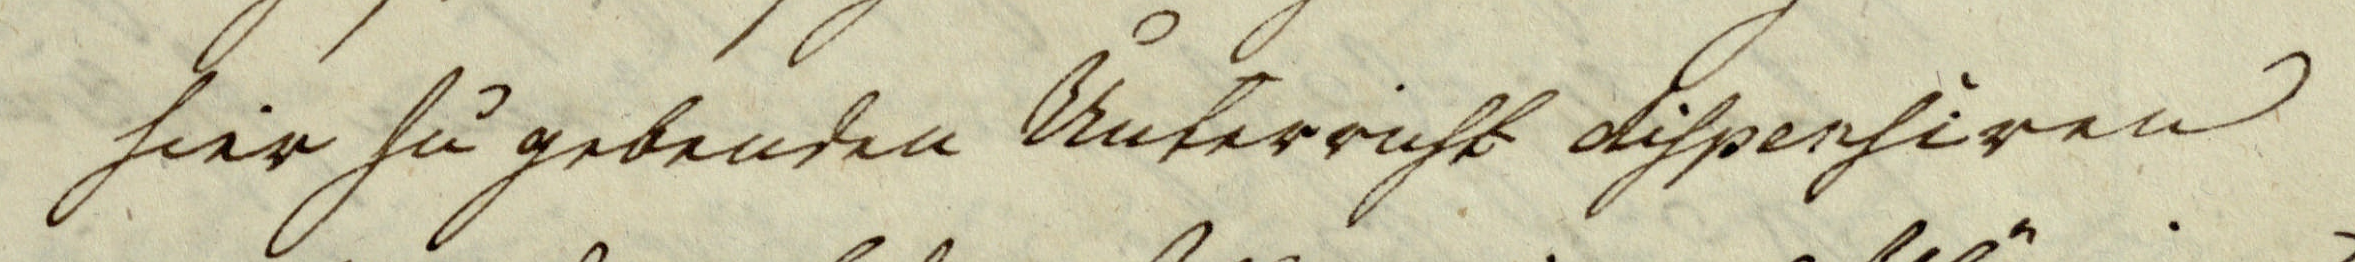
hier zu gebenden Unterricht dispensiren
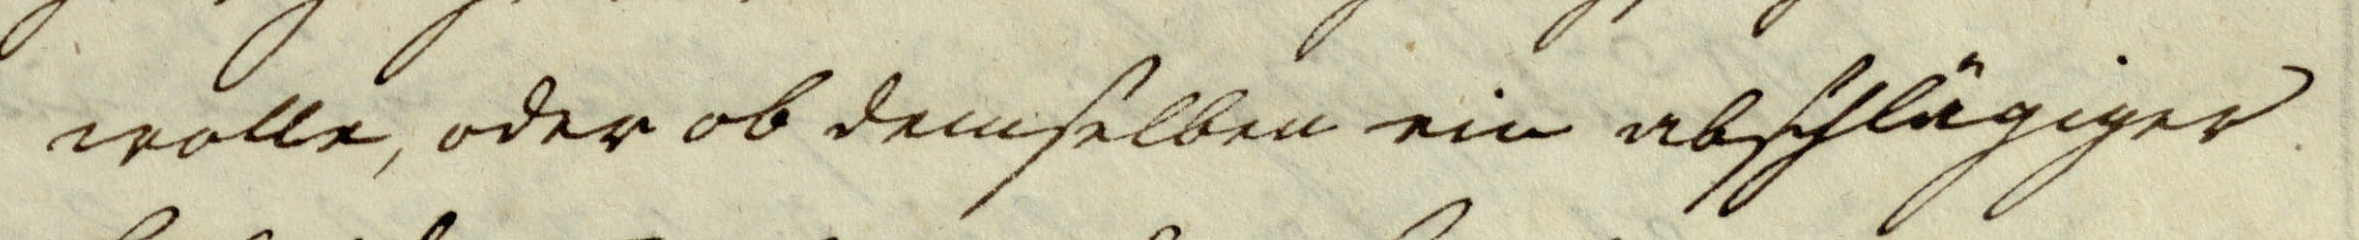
wolle, oder ob demselben ein abschlägiger
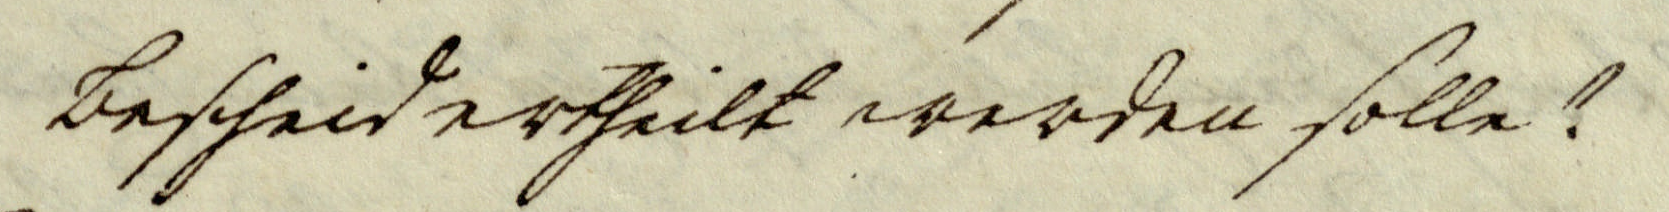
Bescheid ertheilt werden solle?
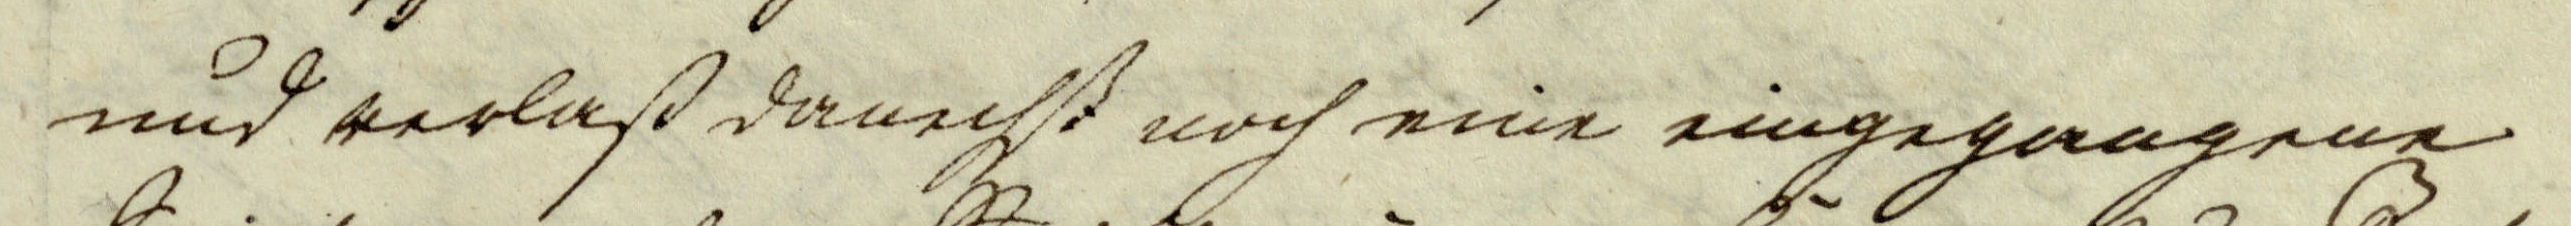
und verlaß danechst noch eine eingegangene
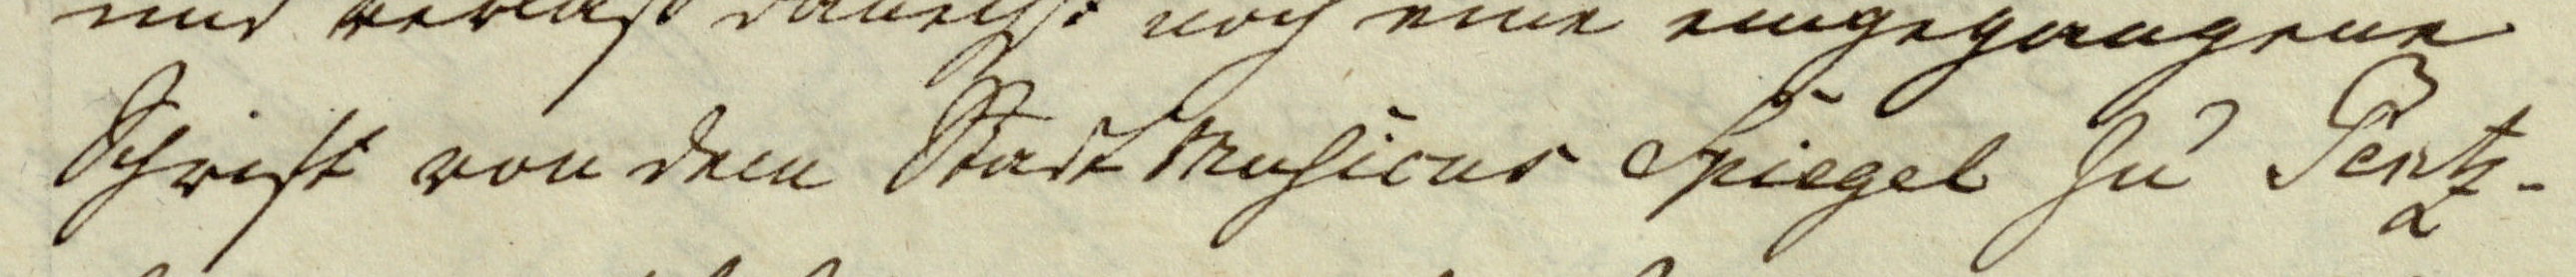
Schrift von dem Stadt Musicus Spiegel zu Pentz¬
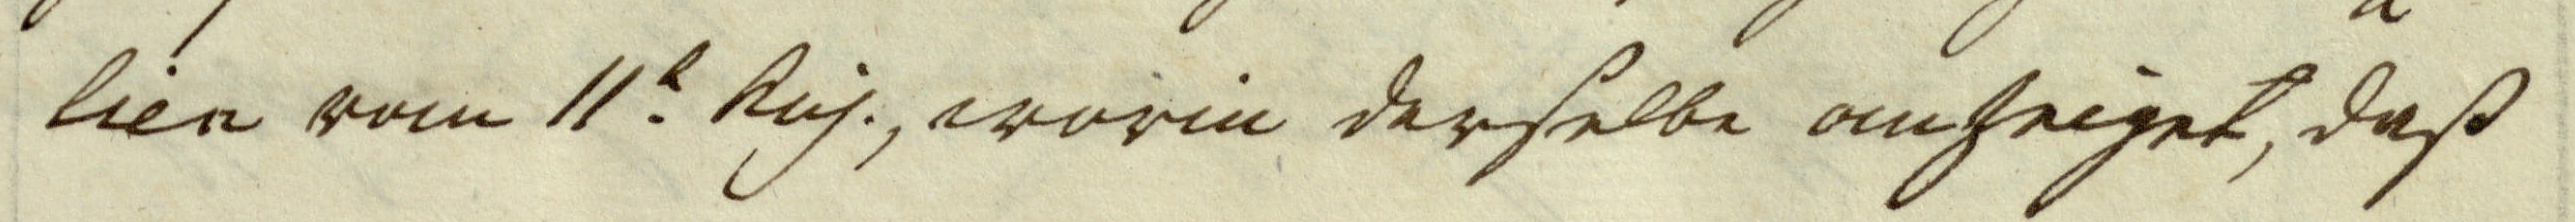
lien vom 11t. huj., worin derselbe aufzeiget, daß
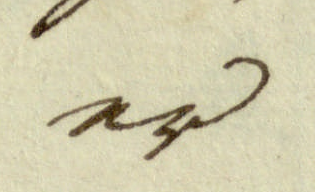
er
